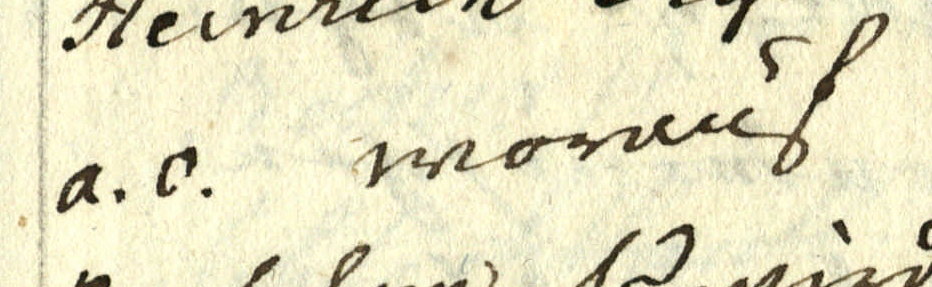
a. c. worauf
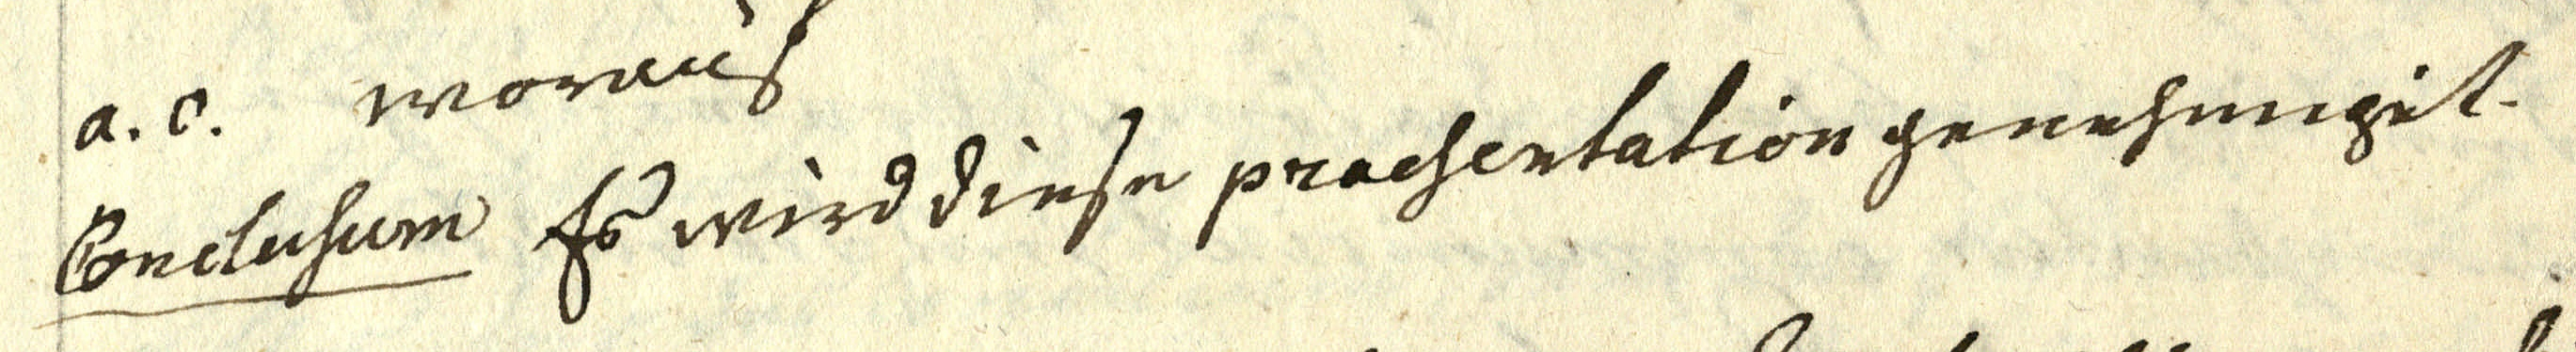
Conclusum Es wird diese praesentation genehmiget.
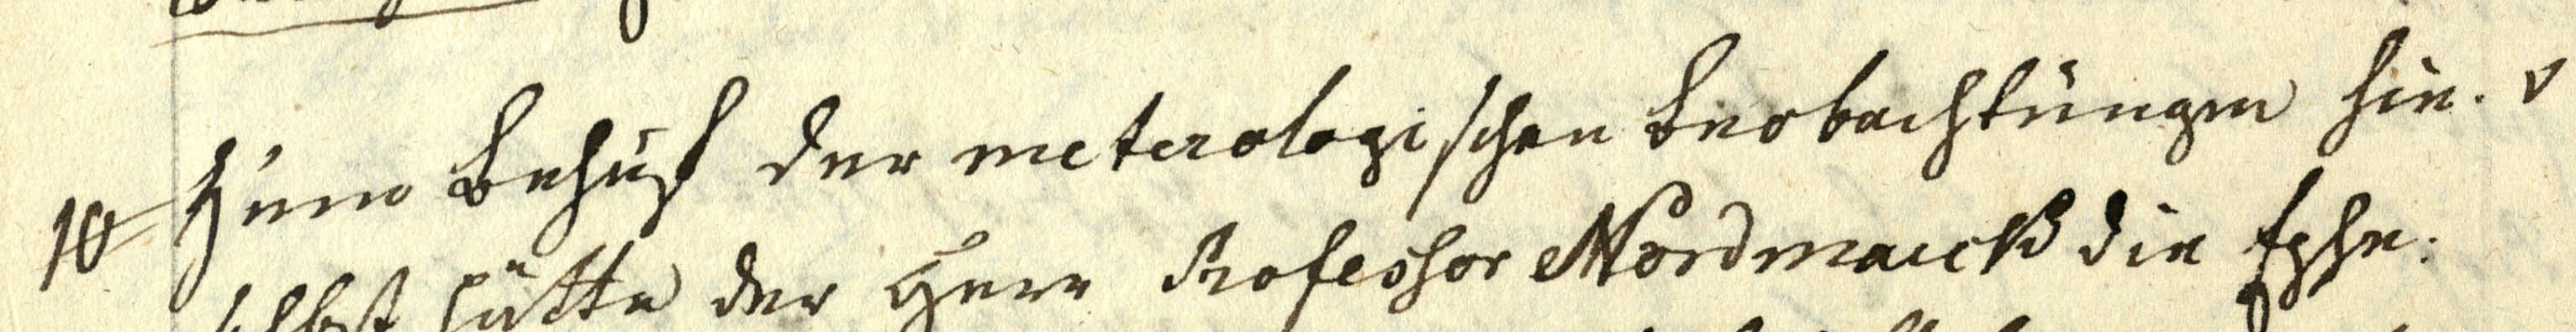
10 Zum Behuf der meteorologischen Beobachtungen hie¬
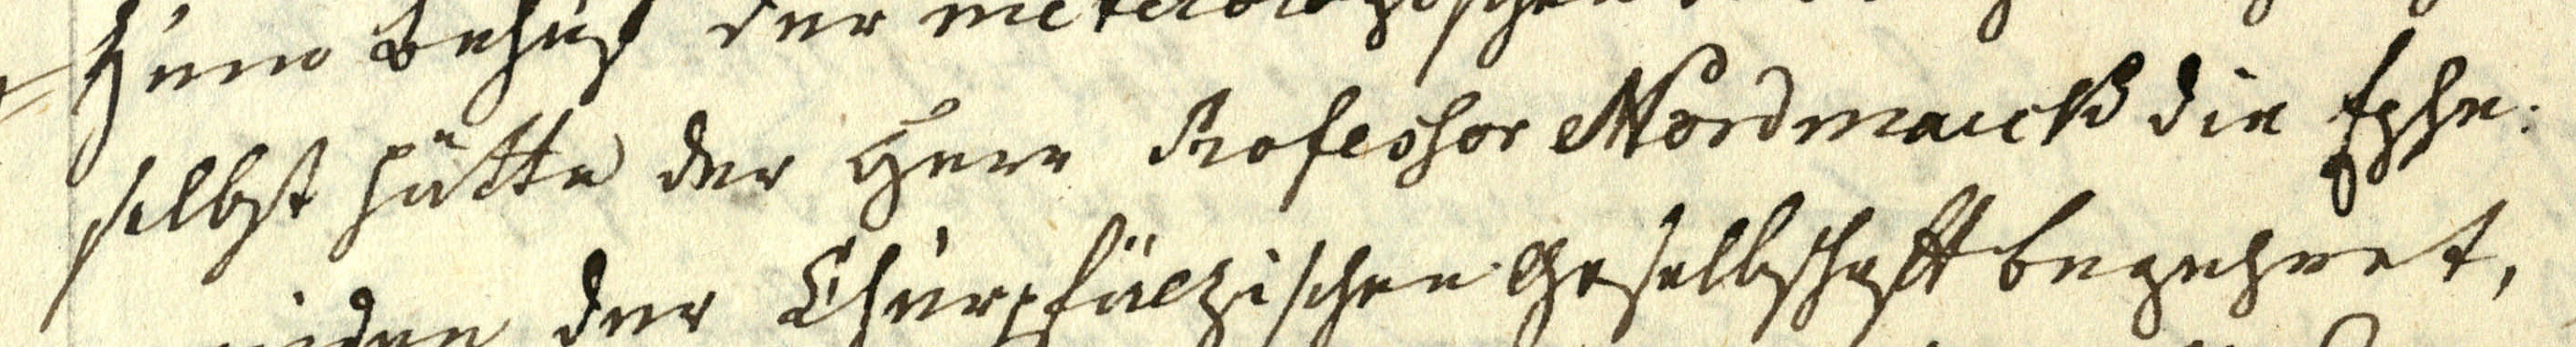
selbst hätte der Herr Professor Nordmarck die Ephe¬
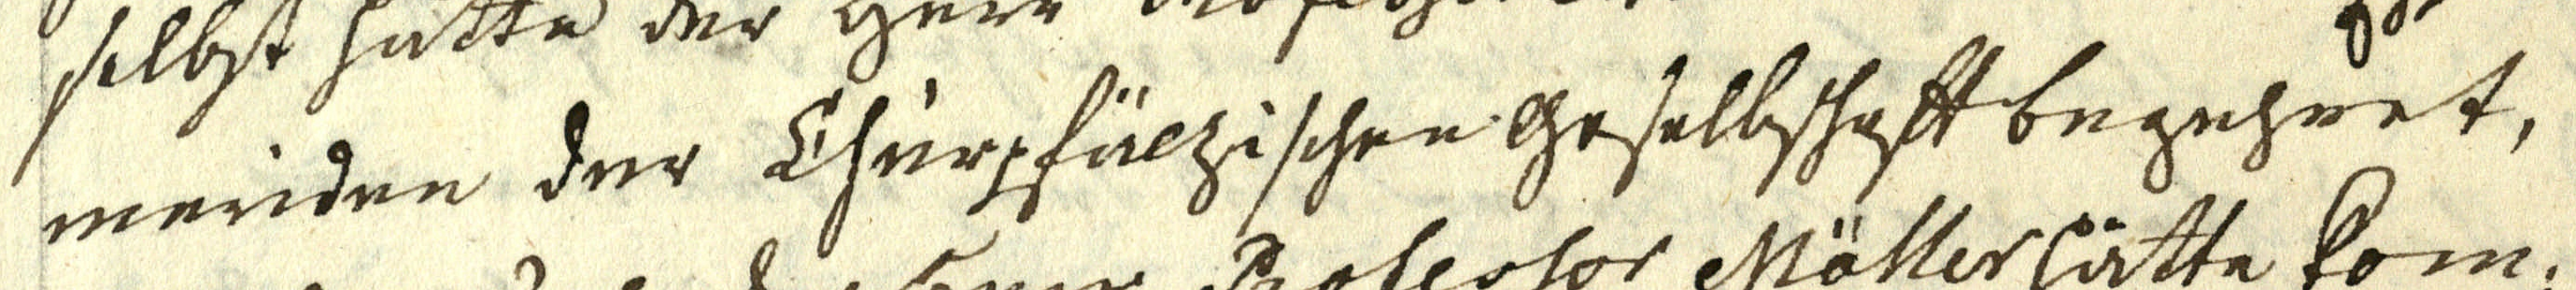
meriden der Churpfälzischen Gesellschaft begehret,
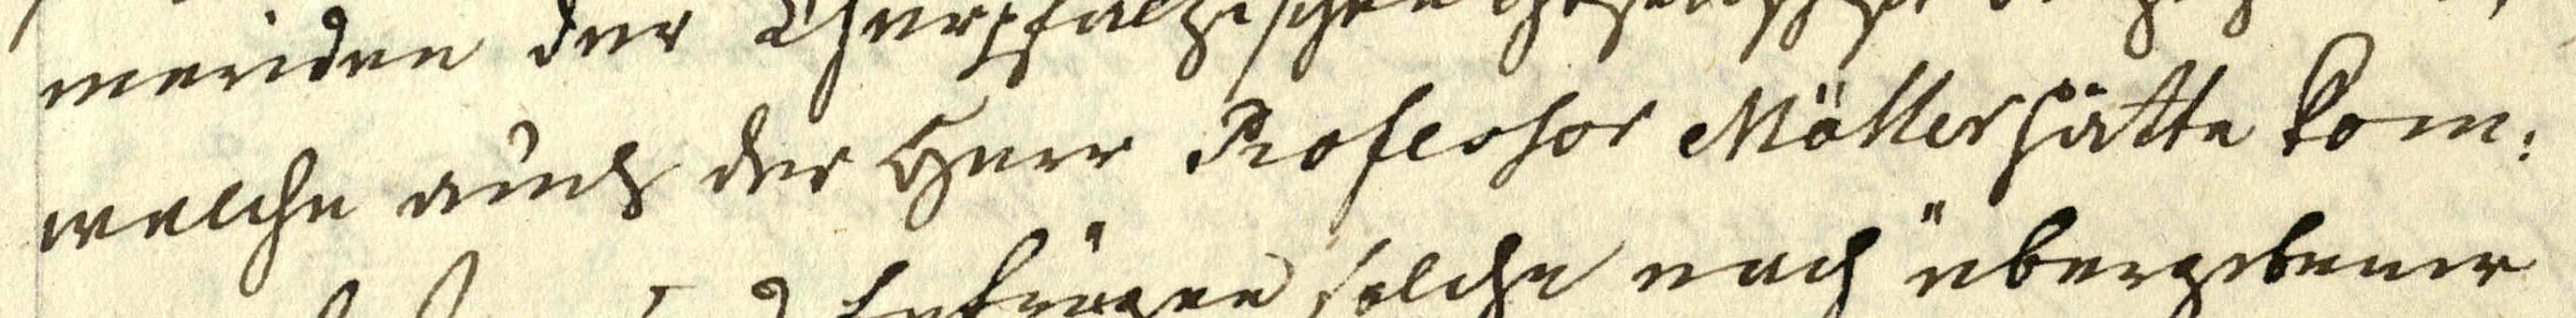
welche auch der Herr Professor Möller hätte kom¬
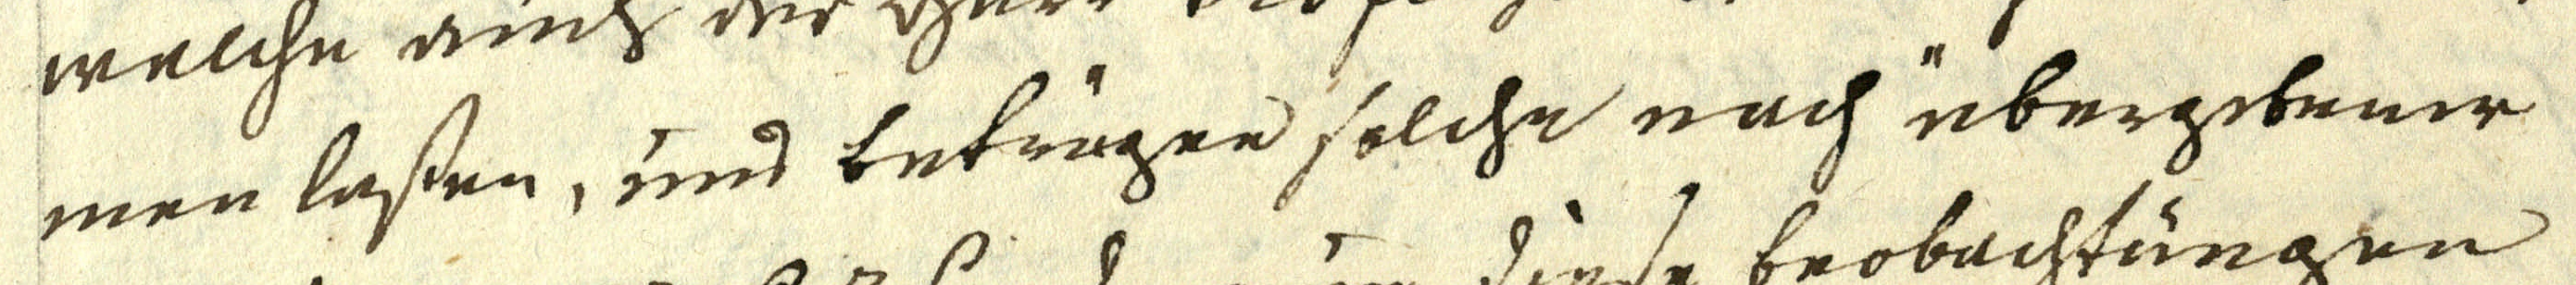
men laßen, und betrügen solche nach übergebener
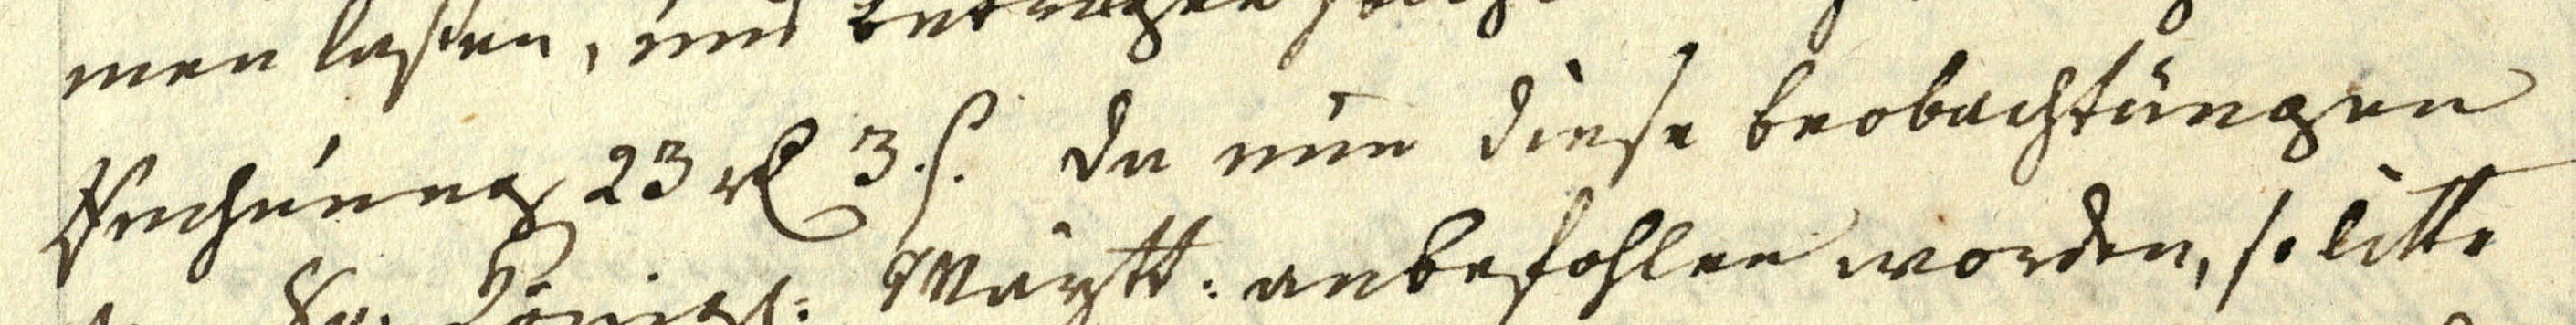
Rechnung 23 r. 3 s. da nun diese Beobachtungen
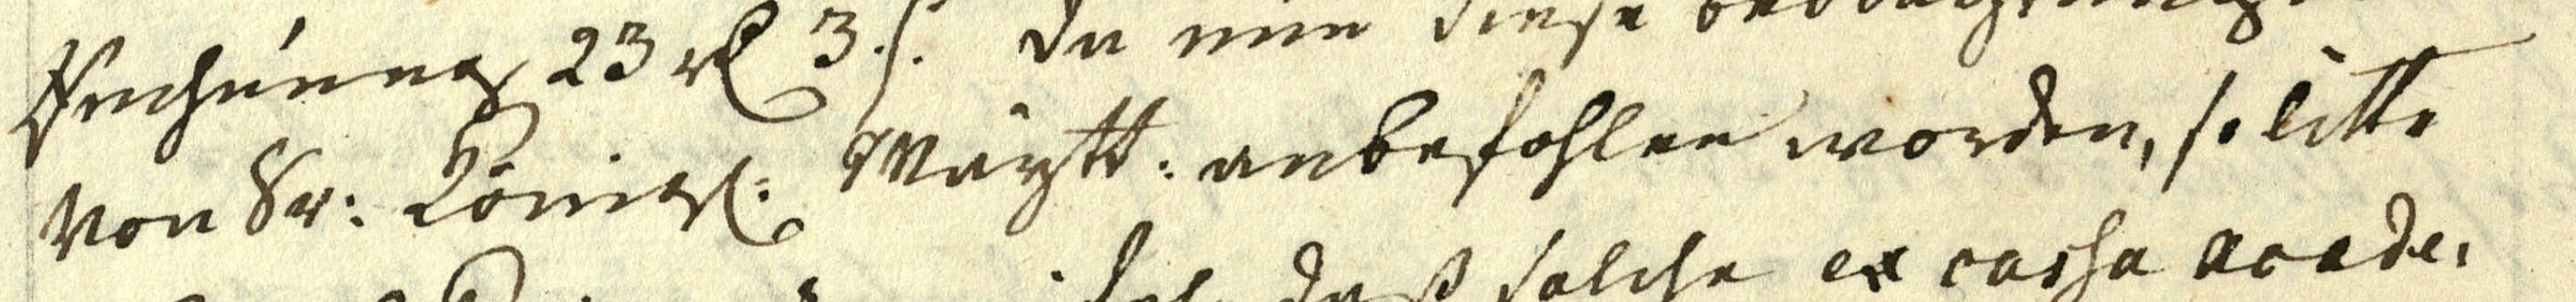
von Sr Königl. Maÿtt. anbefohlen worden, so litte
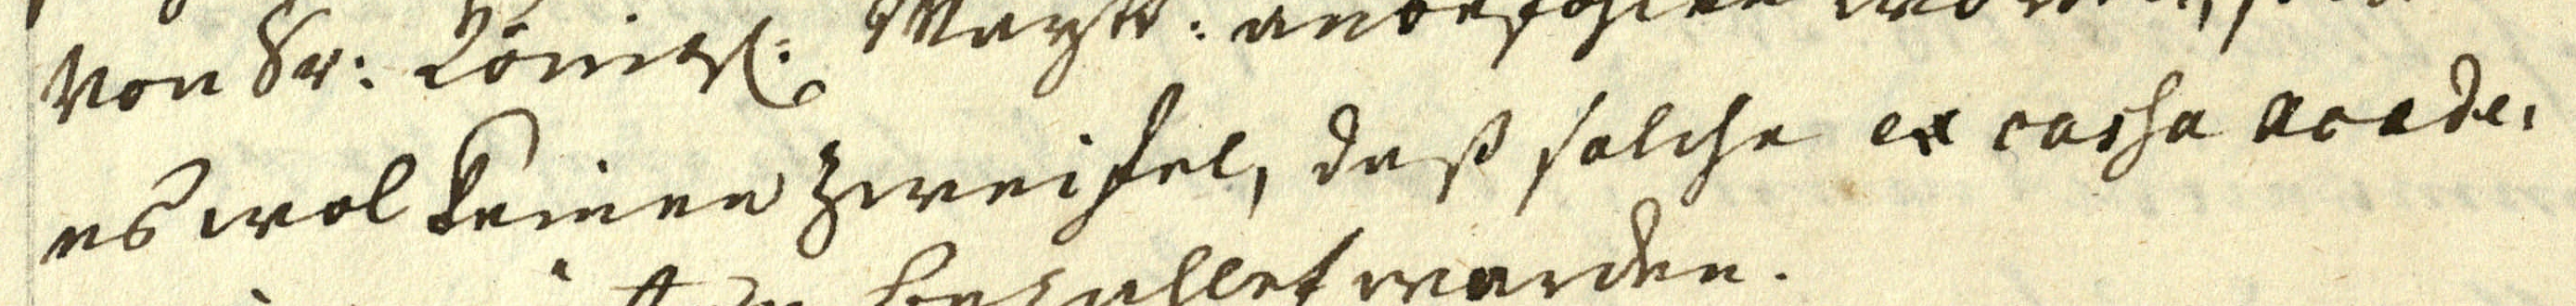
es wol keinen Zweifel, daß solche ex cassa Acade¬
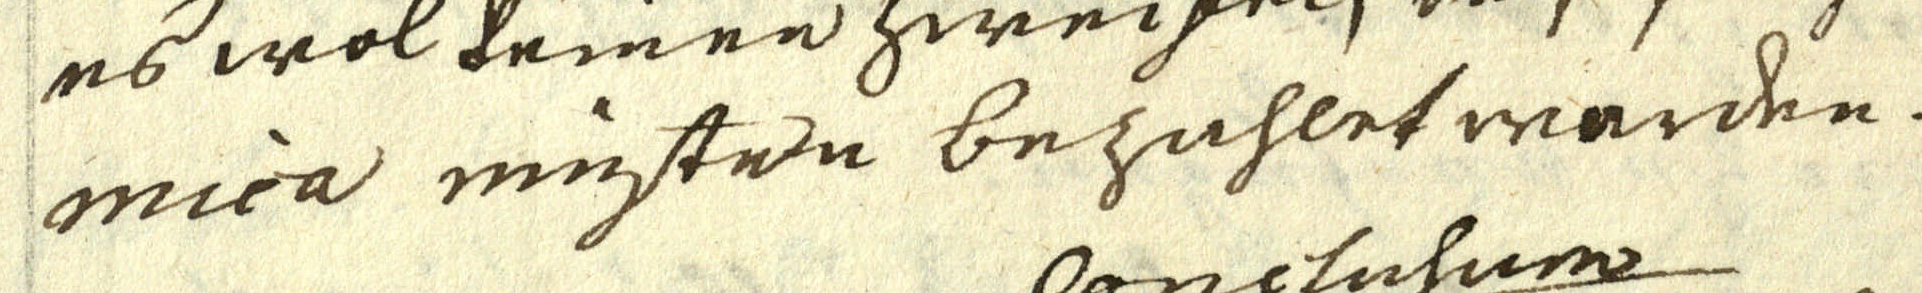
mica müsten bezahlet werden.
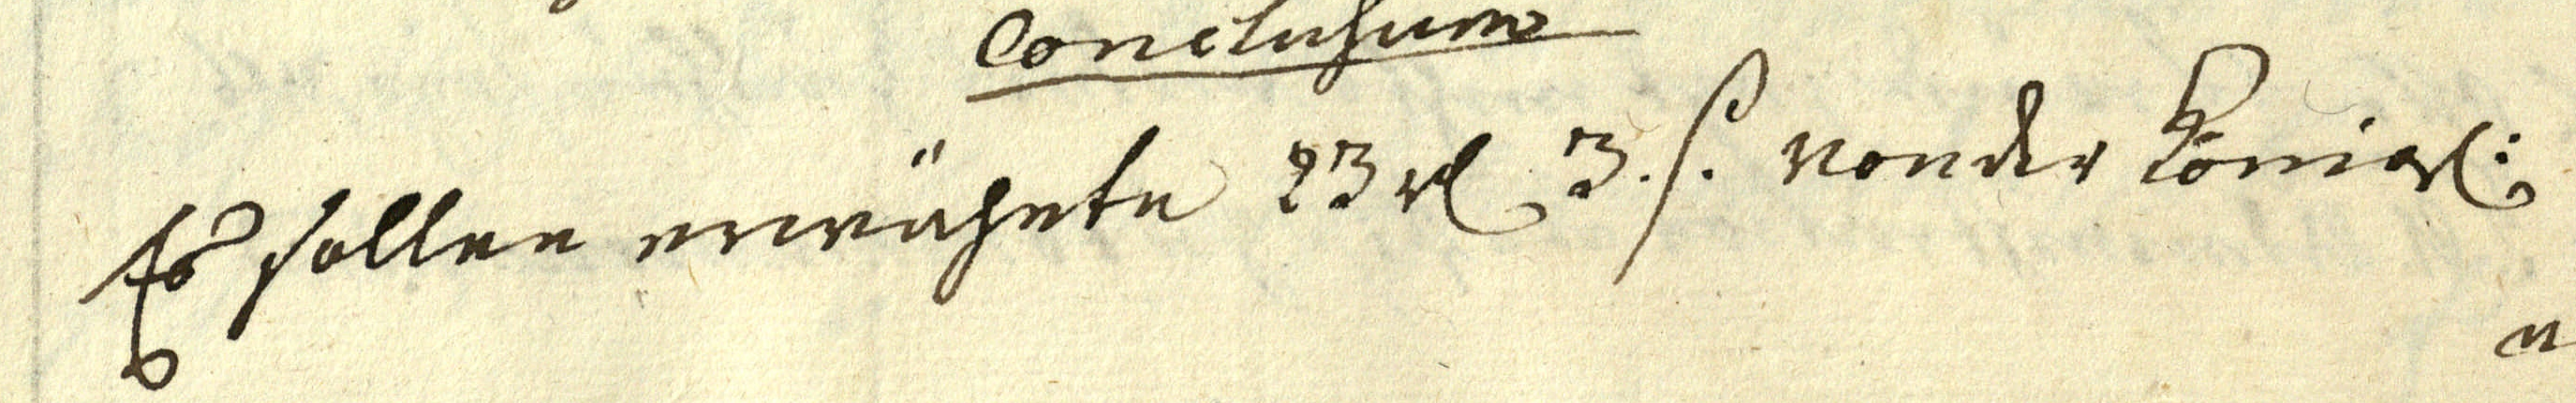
Er sollen erwähnte 23 r. 3 s. von der Königl.
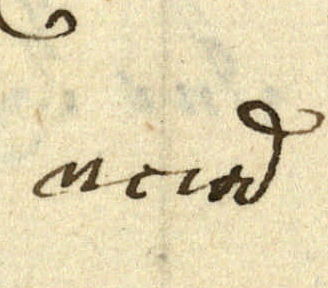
acad
